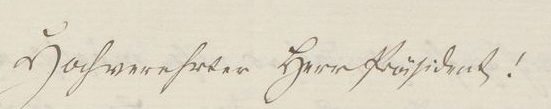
Hochverehrter Herr Präsident!
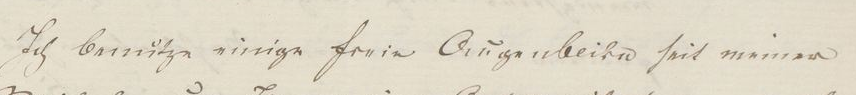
Ich benutze einige freie Augenblike seit meiner
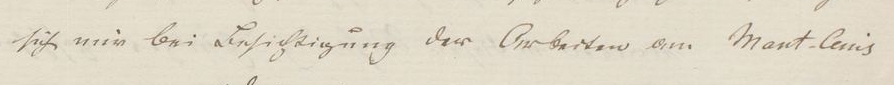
sich mir bei Besichtigung der Arbeiten am Mont-Cenis
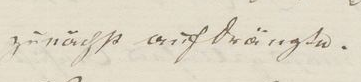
zunächst aufdrängte.
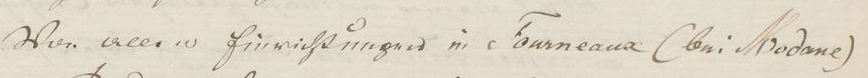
Von allen Einrichtungen in Fourneaux (bei Modane )
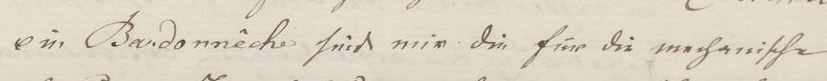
& in Bardonnêche sind mir die für die mechanische
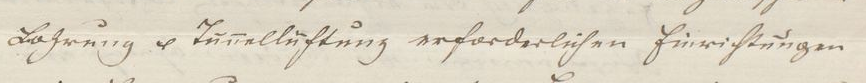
Bohrung & Tunnelführung erforderlichen Einrichtungen
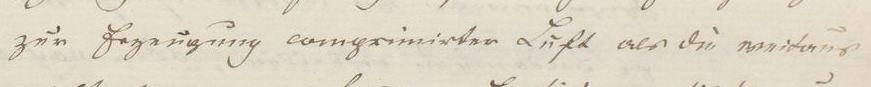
zur Erzeugung comprimirter Luft als die weitaus
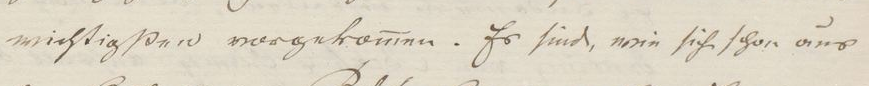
wichtigsten vorgekommen. Es sind, wie sich schon aus
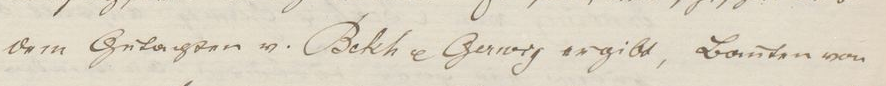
den Gutachten v. Bekh und Gerwig ergibt, Bauten von
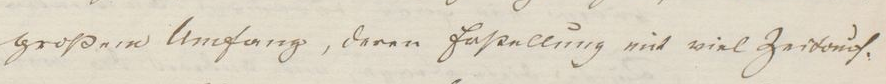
großem Umfang, deren Erstellung mit viel Zeitauf-
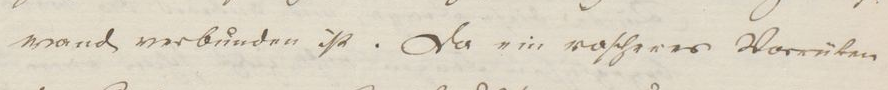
wand verbunden ist. Da ein rascheres Vorrüken
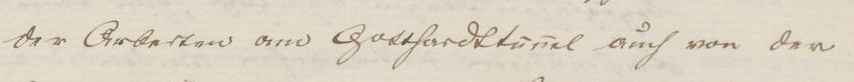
der Arbeiten am Gotthardttunnel auch von der
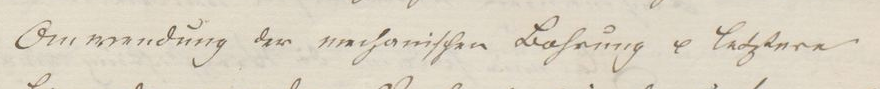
Anwendung der mechanischen Bohrung & letztere
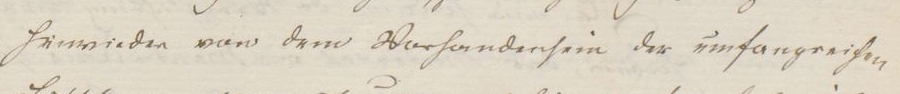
hinwieder von dem Vorhandensein der umfangreichen
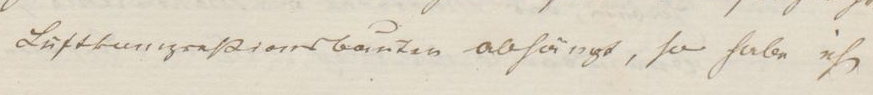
Luftkompreßionsbauten abhängt, so habe ich
